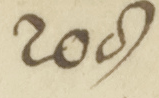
208
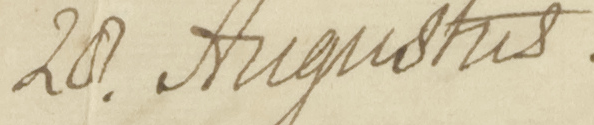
28. Augustus.
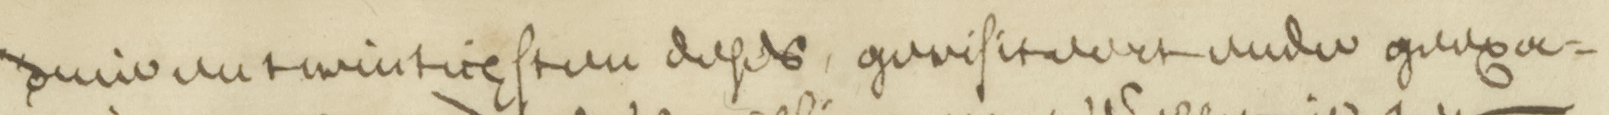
drie en twintichsten deses, gevisiteert ende geexa„
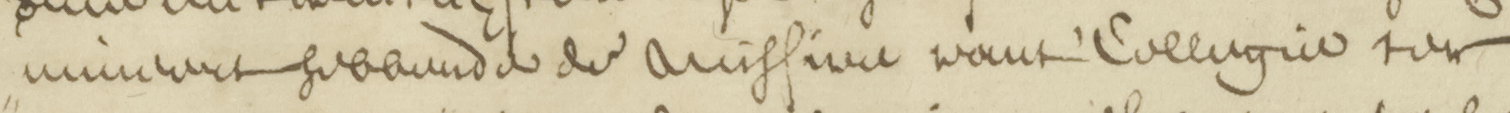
,,mineert hebbende de missive vant' Collegie ter
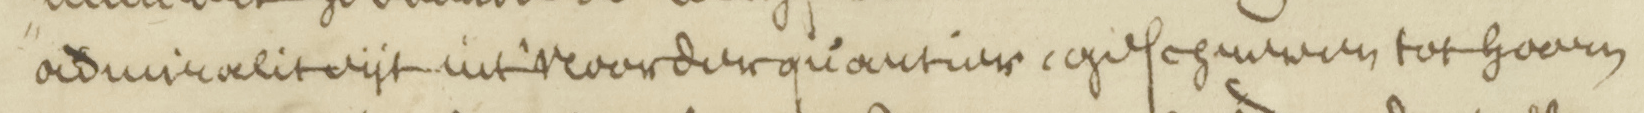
admiraliteijt int Noorderquartier, geschreven tot Hoorn
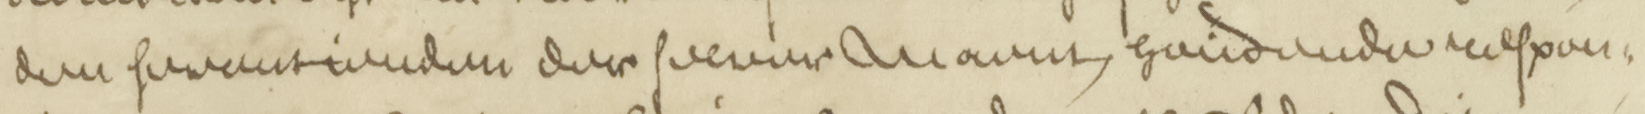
den seventienden der selver maent, houdende respon„
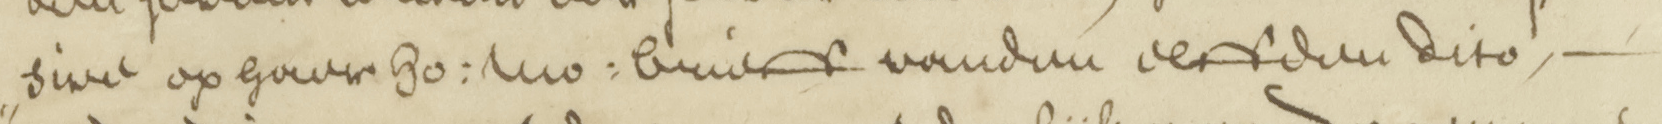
,,sive op haer Ho:Mo: brieff vanden elffden dito, -
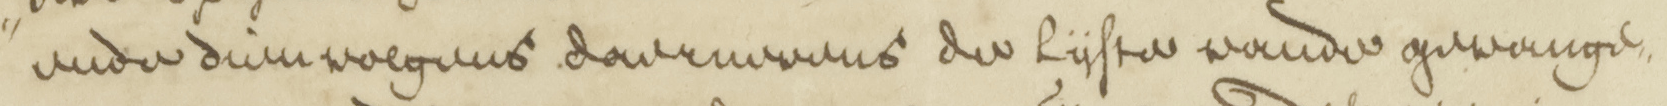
ende dienvolgens daernevens de lijste vande gevange„
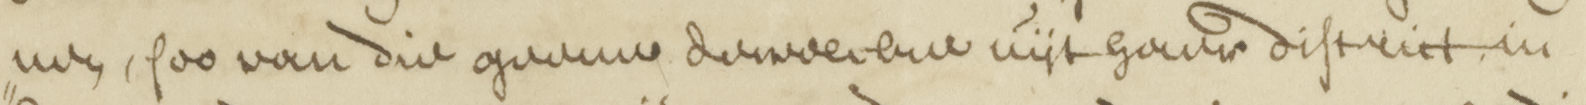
,,nen, soo van die geene dewelcke uijt haer district in
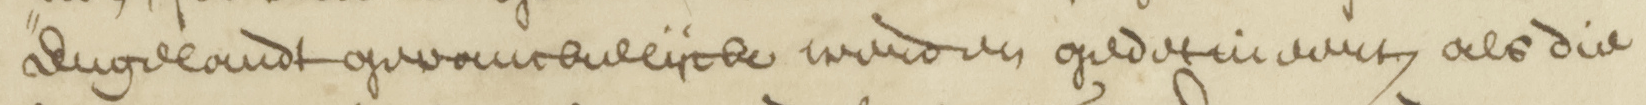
Engelandt gevanckelijck werden gedetineert, als die
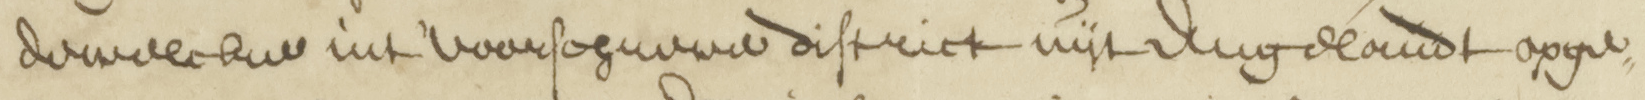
dewelcke int voorschreve district uijt Engelandt opge„
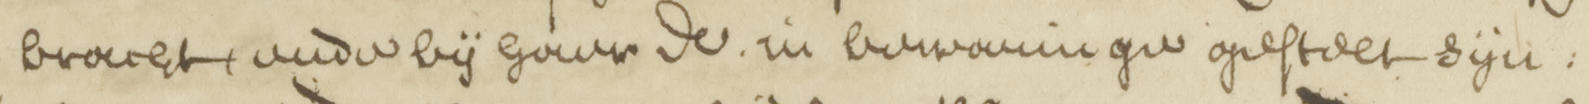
,,bracht, ende bij haer E. in bewaringe gestelt sijn.
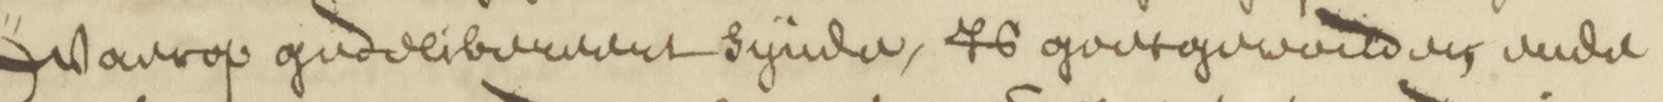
Waerop gedelibereert sijnde, Is goetgevonden ende
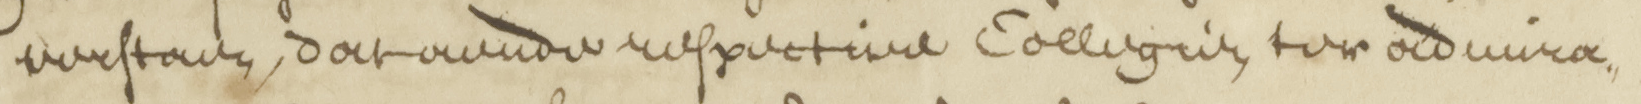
verstaen, dat aende respective Collegien ter admira„
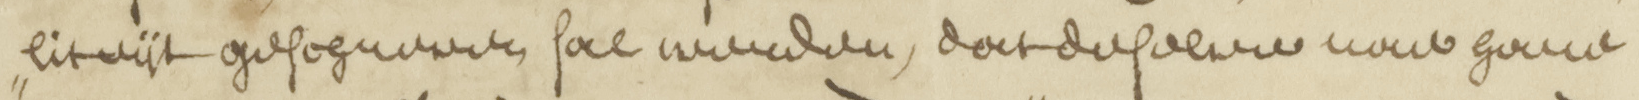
,,liteijt geschreven sal werden, dat deselve nae hare
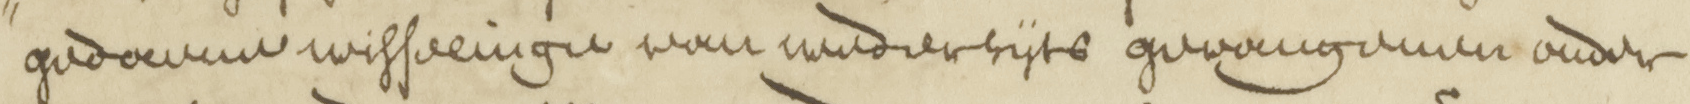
gedaene wisselinge van wedersijts gevangenen onder
